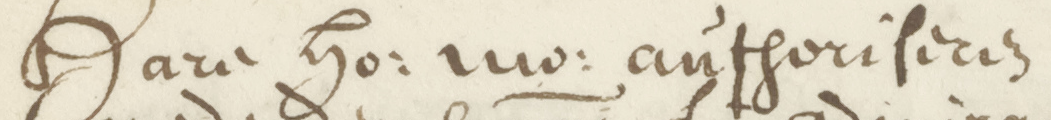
Hare ho:mo: authoriseren
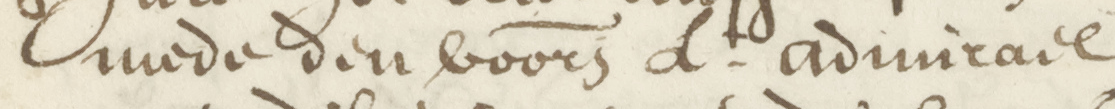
mede den voorn Lt. Admirael
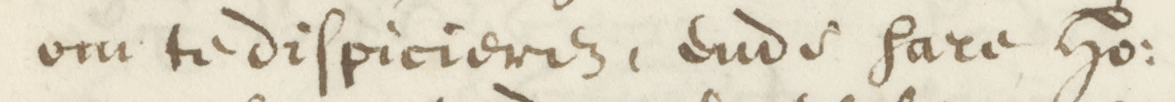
om te dispicieren, ende hare Ho:
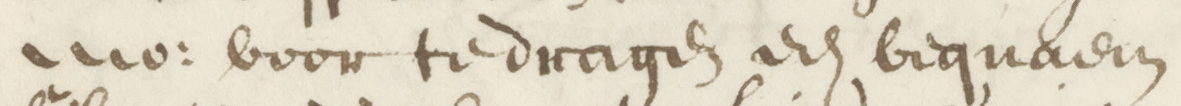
mo: voor te dragen een bequaem
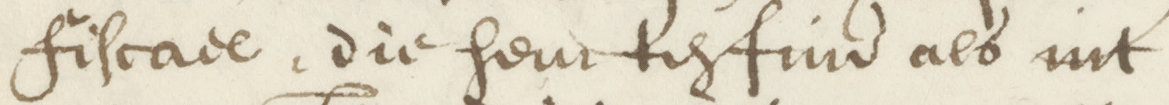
fiscael, die hem ten fine als int
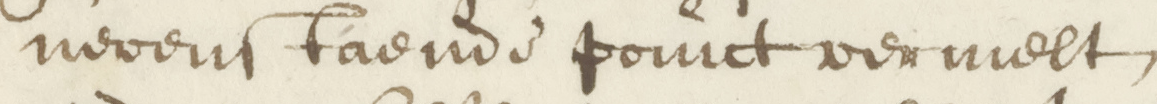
nevenstaende poinct vermelt,
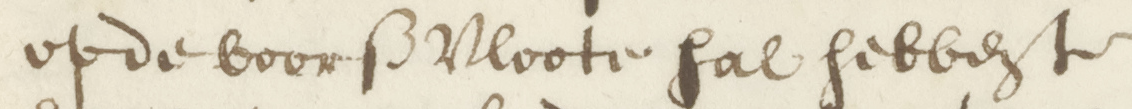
opde voors Vloote sal hebben te
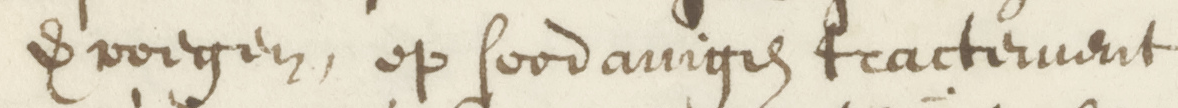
vvoegen, op soodanigen tractement
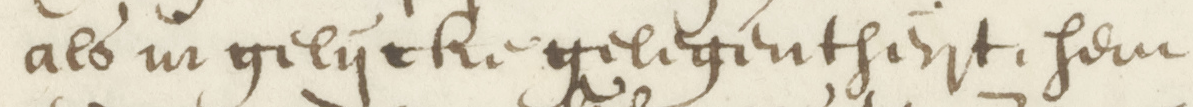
als in gelijcke gelegentheijt, hem
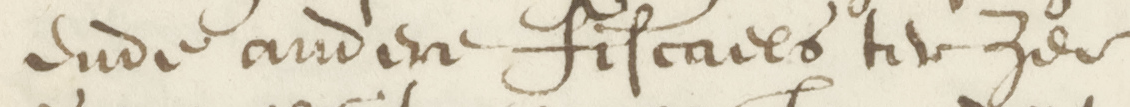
ende andere Fiscaels ter Zee
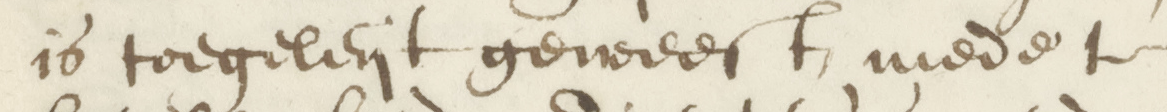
is toegeleijt geweest, mede te
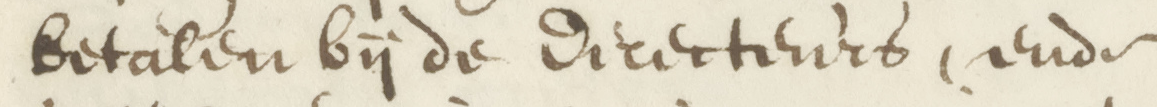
betalen bij de Directeurs, ende
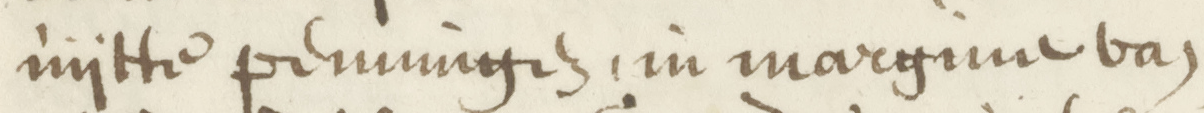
uijtte penningen, in margine van
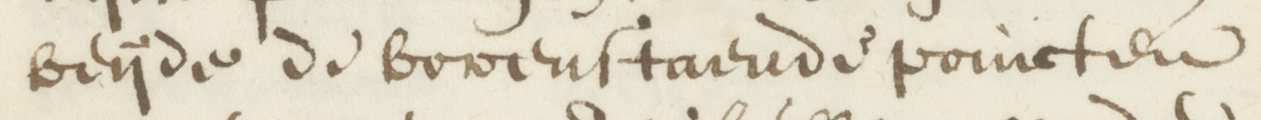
beijde de bovenstaende poincten
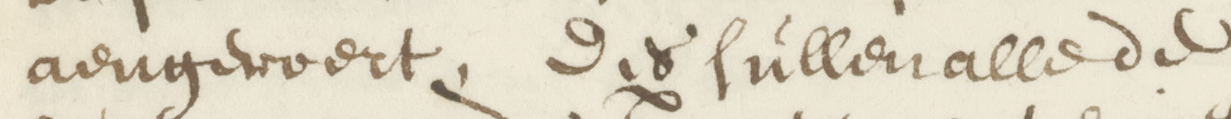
aengeroert, Des sullen alle de
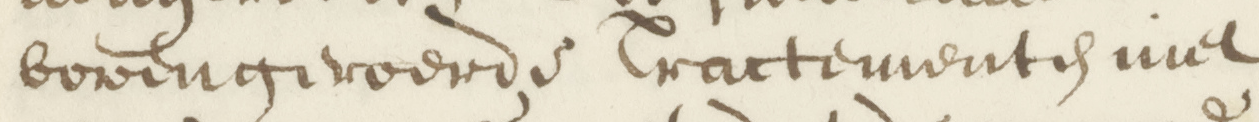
bovengeroerde Tractementen niet
